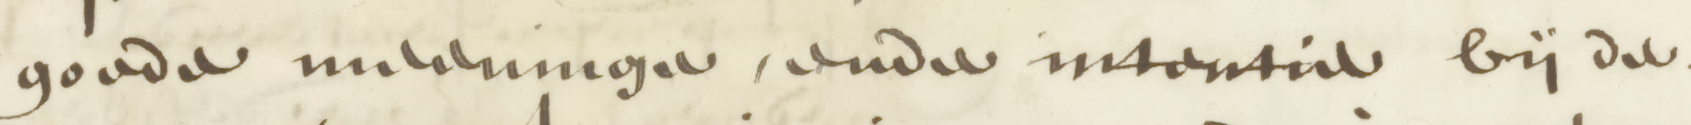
goede meeninge, ende intentie bij de
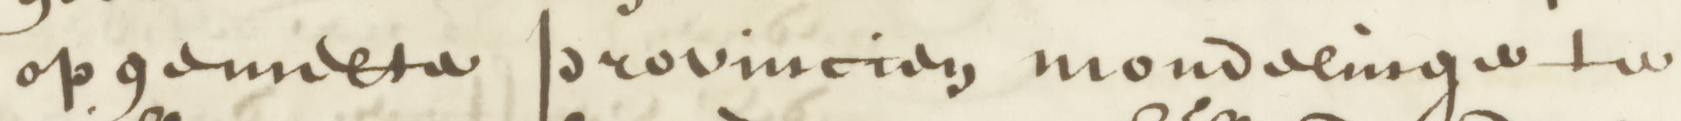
op gemelte provincien mondelinge te
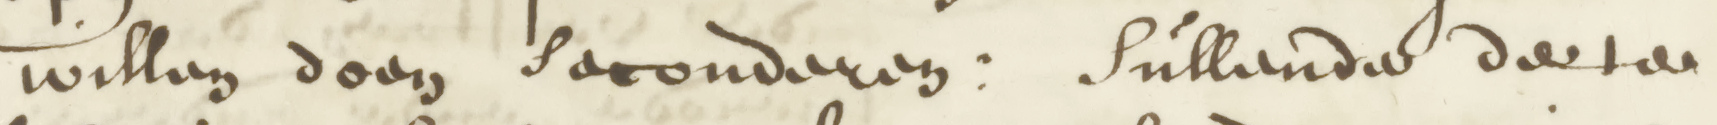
willen doen seconderen: Sullende de te
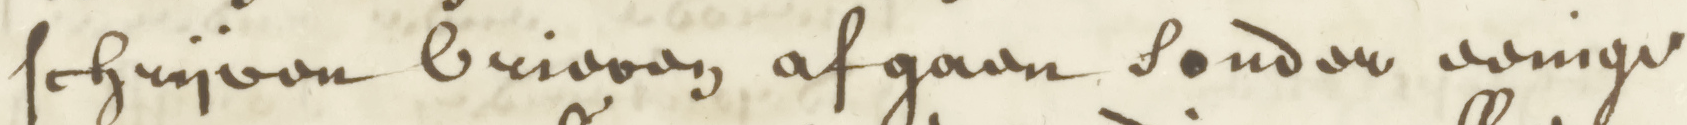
schrijven brieven afgaen sonder eenige
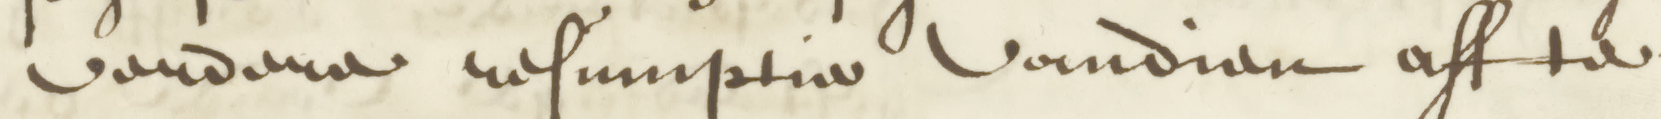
verdere resumptie vandien aff te
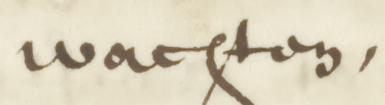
wachten.
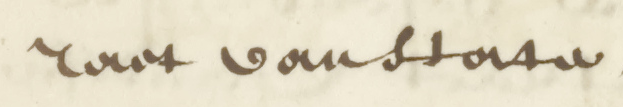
raet van State
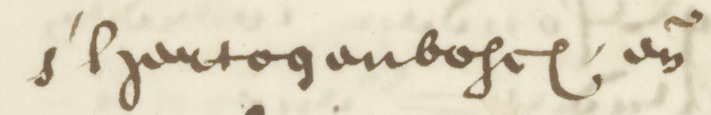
s'Hertogenbosch, en
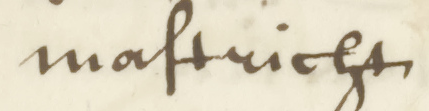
mastricht
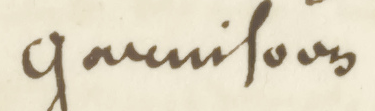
Garnisoen
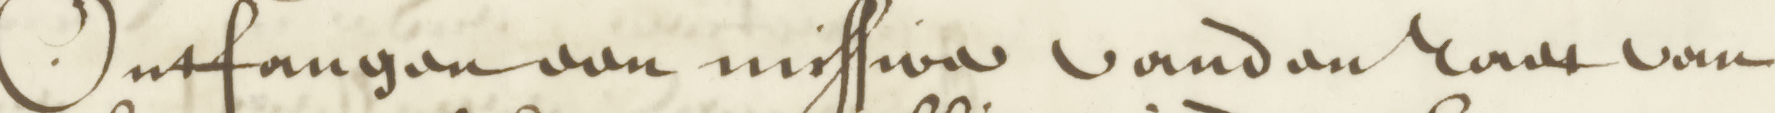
Ontfangen een missive vanden raet van
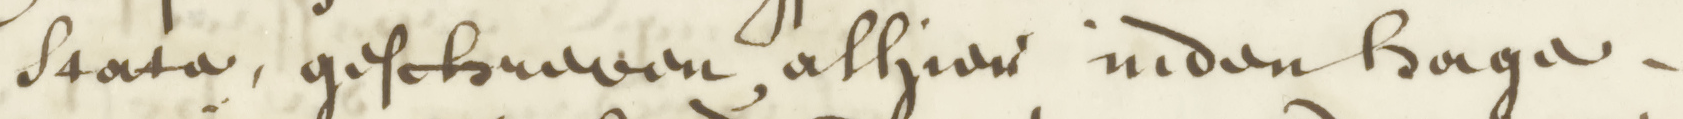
State, geschreven alhier inden Hage
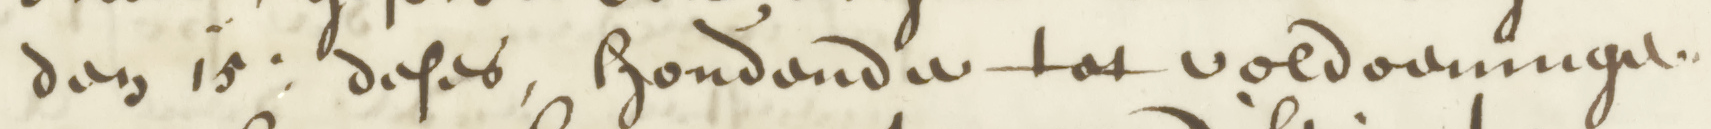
den 15: deses, houdende tot voldoeninge
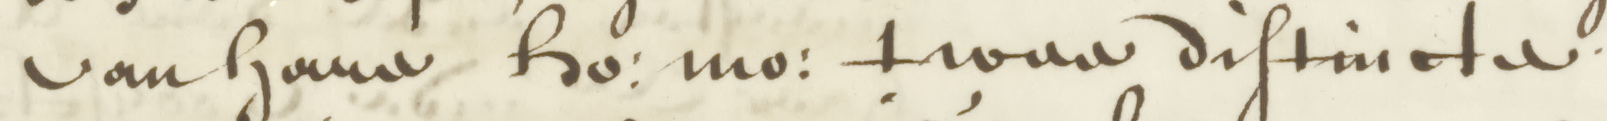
van hare Ho:Mo: twee distincte
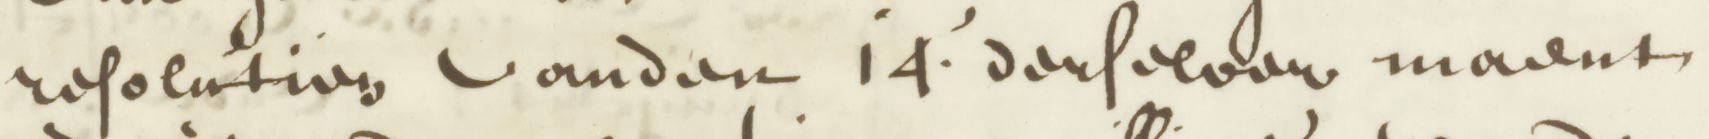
resolutien vanden 14e. derselver maent
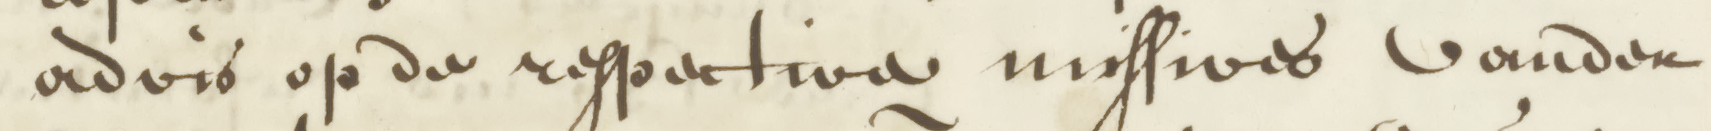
advis op de respective missives vanden
